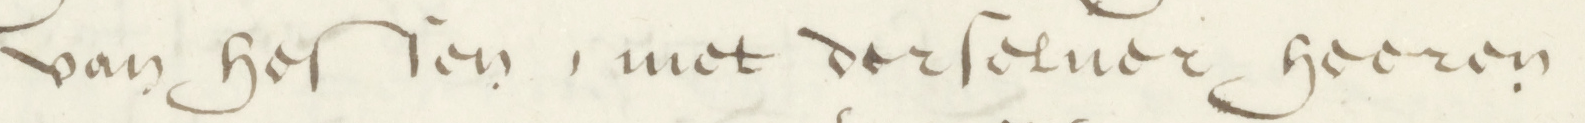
van hessen, met derseluer heeren
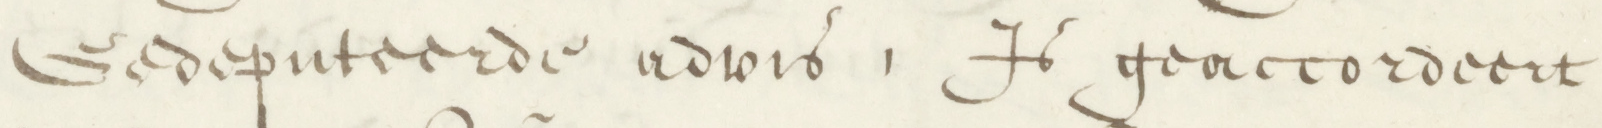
Gedeputeerde advis. Is geaccordeert
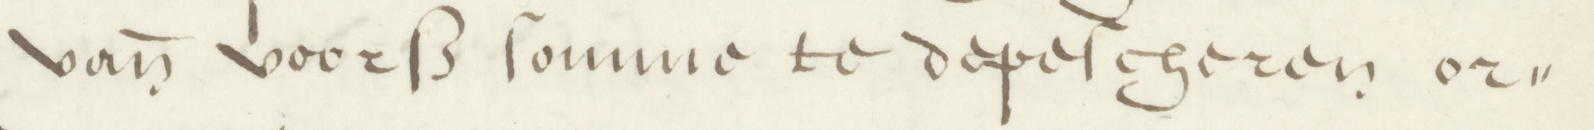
van voors somme te depescheren or,,
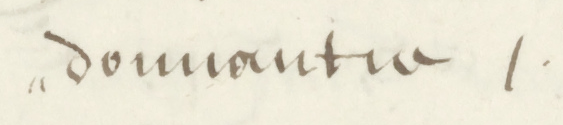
,,donnantie.
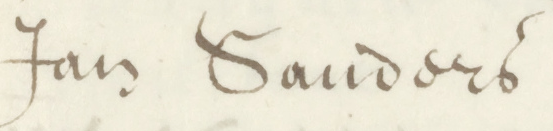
Jan Sanders
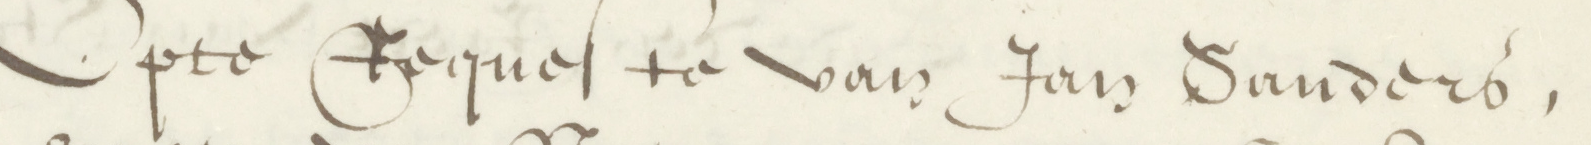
Opte Requeste van Jan Sanders,
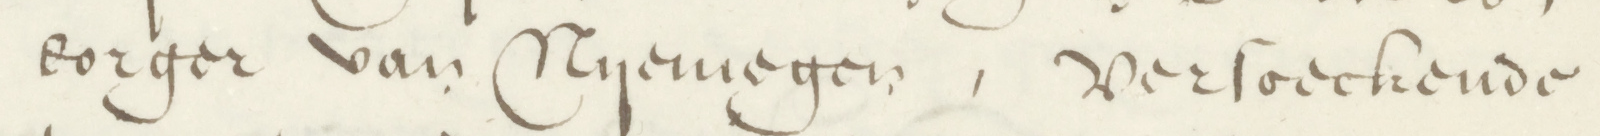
borger van Nyemegen, Versoeckende
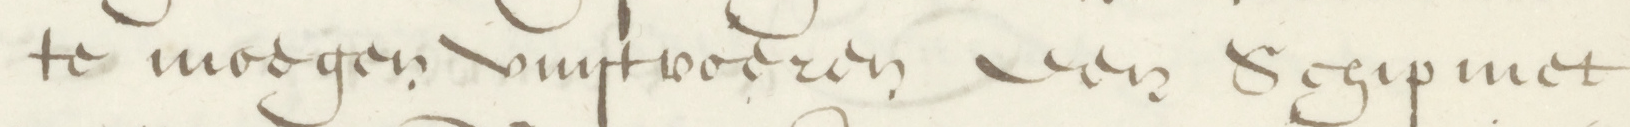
te moegen vuytvoeren een Schip met
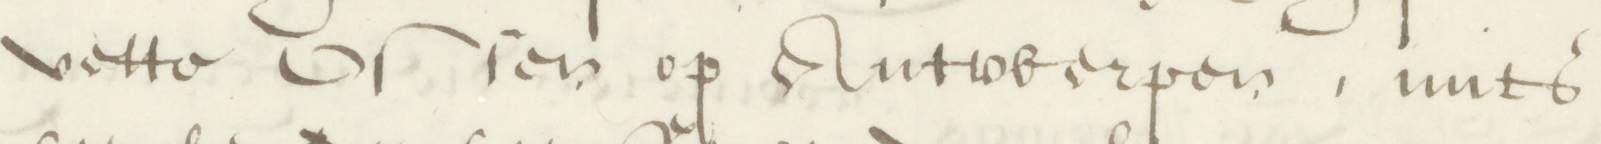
vette Ossen op Antwerpen, mits
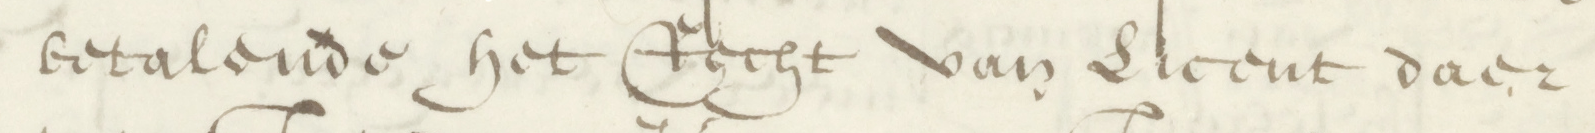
betalende het Recht van Licent daer
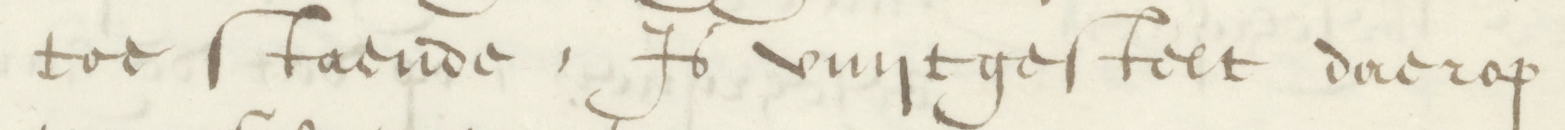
toe Staende. Is vuytgestelt daerop
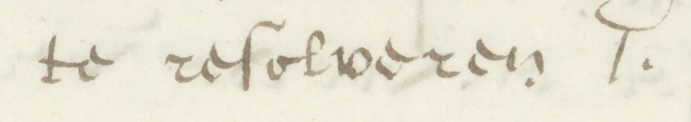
te resolveren.
